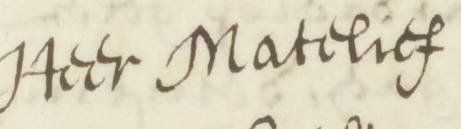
Heer Matelief
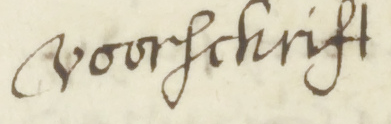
voorschrift
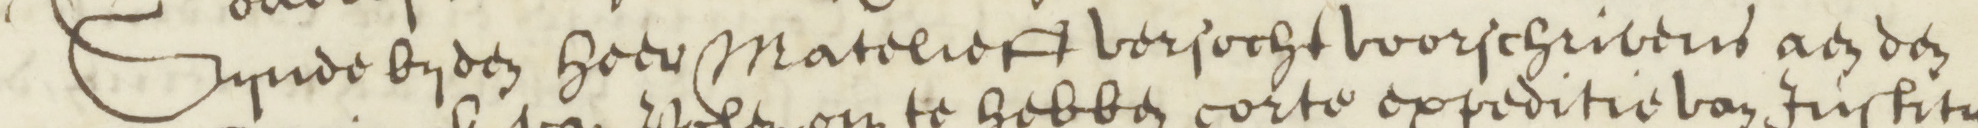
Synde byden heer Matelieff versocht voorschrivens aen den
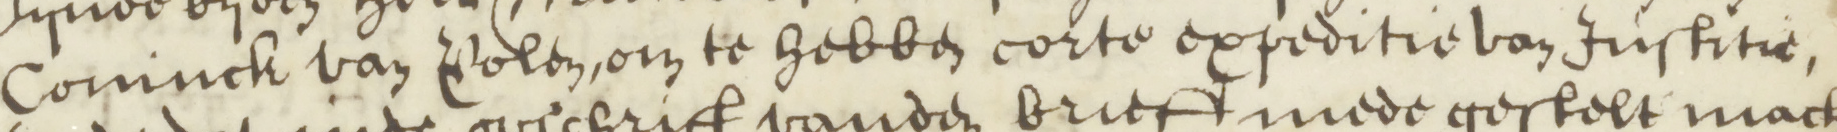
Coninck van Polen, om te hebben corte expeditie van justitie.
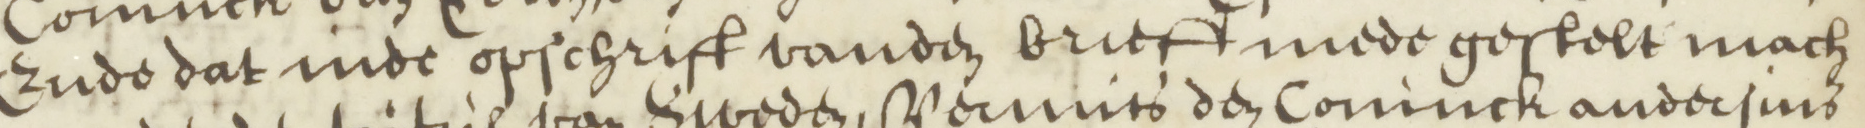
Ende dat inde opschrift vanden brieff mede gestelt mach
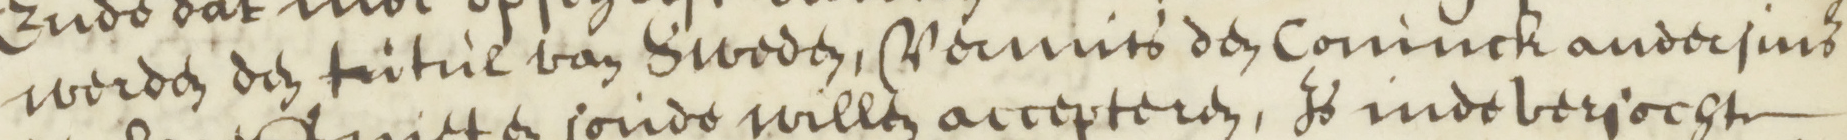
werden den titul van Sweden, Vermits den coninck andersins
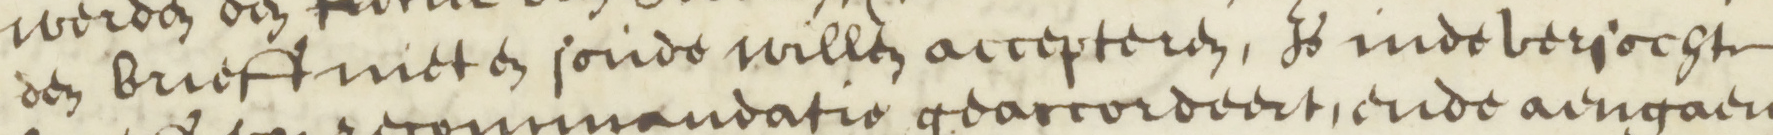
den brieff niet en soude willen accepteren, Is inde versochte
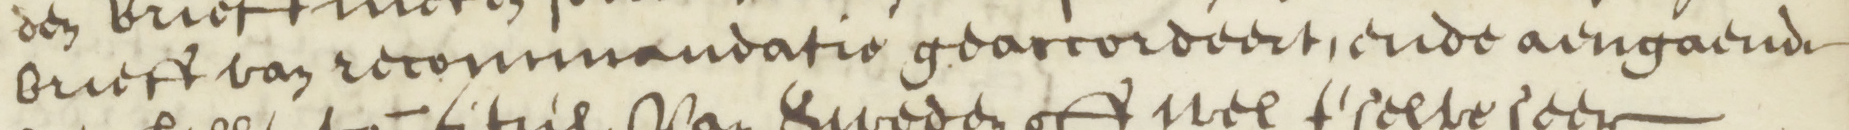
brieff van recommandatie geaccordeert, ende aengaende
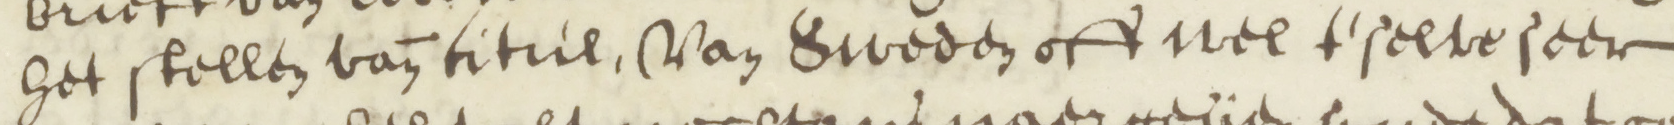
het stellen van titul, Van Sweden off wel t'selve seer
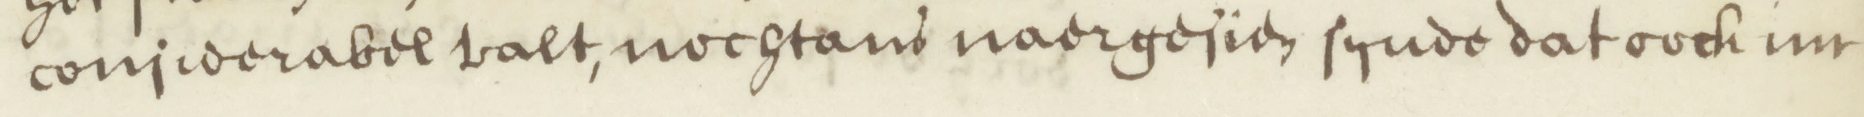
considerabel valt, nochtans naer gesien synde dat oock int
